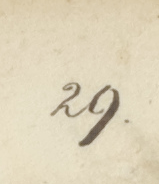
29
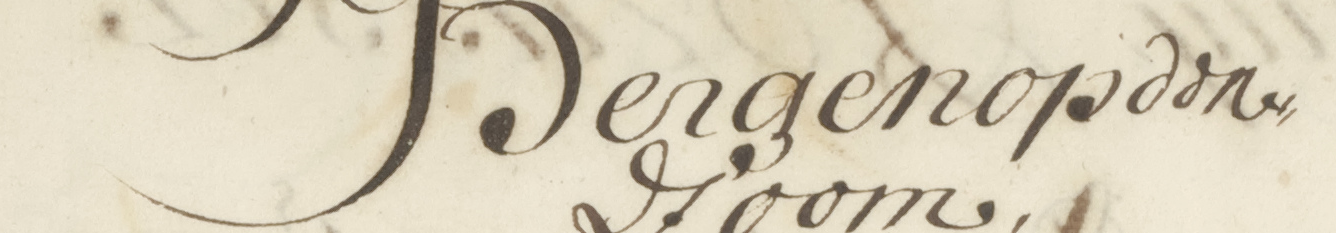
Bergen op den,,
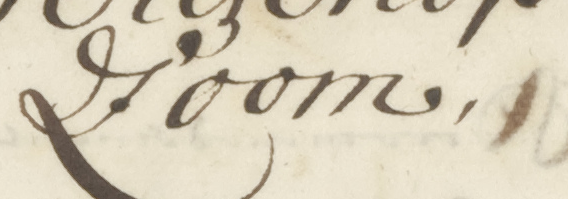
Zoom.
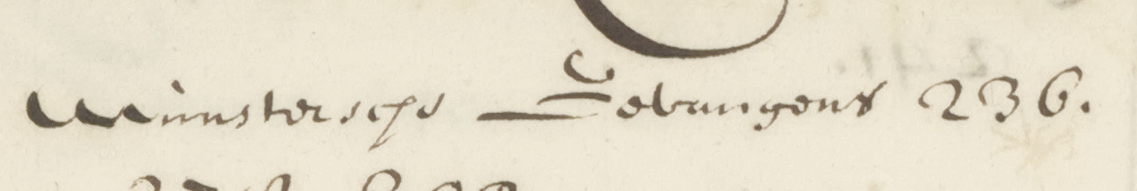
Munstersche Gevangens 236.
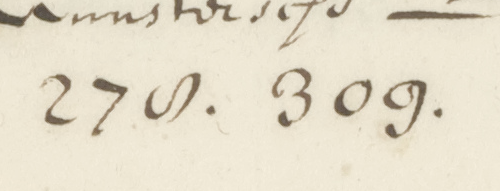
278, 309.
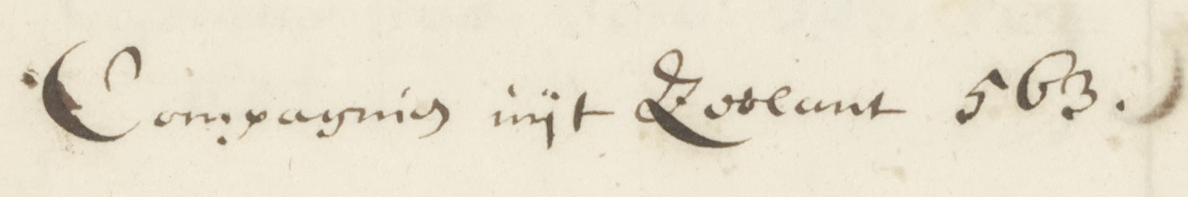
Compagnien uijt Zeelant 563.
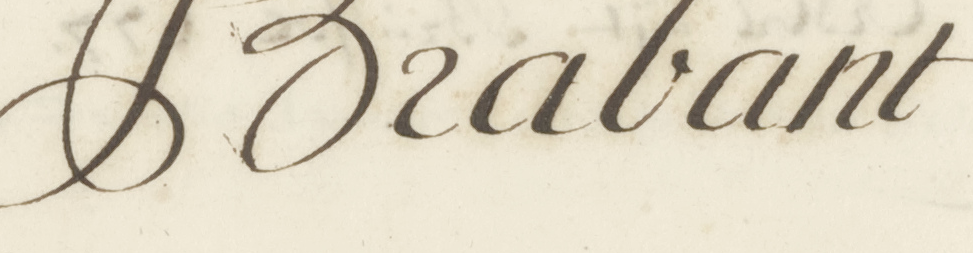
Brabant
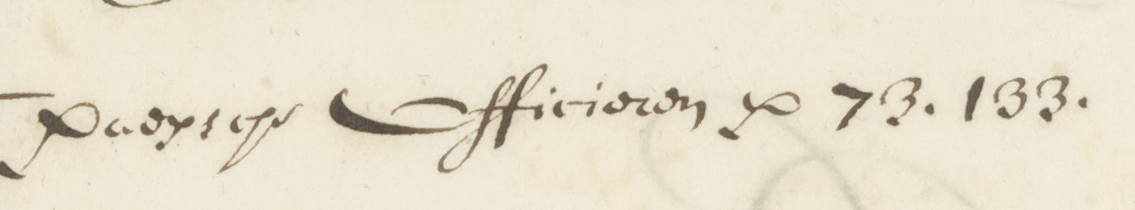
paepsche Officieren p 73. 133.
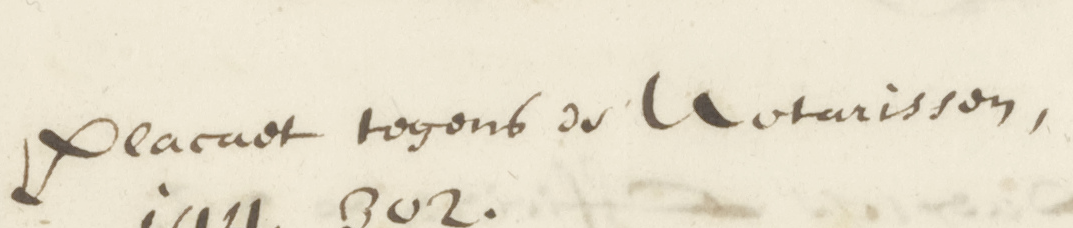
placaet tegens de notarissen
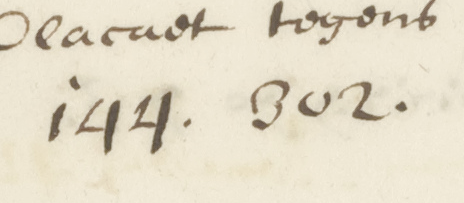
144, 302.
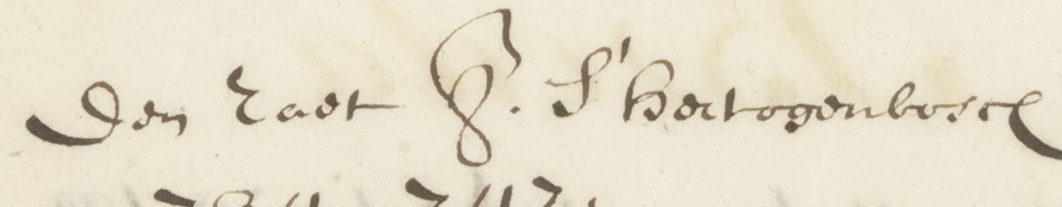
Den raet ca. s'Hertogenbosch
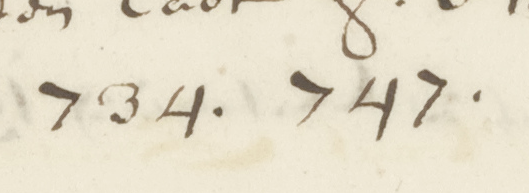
734. 747.
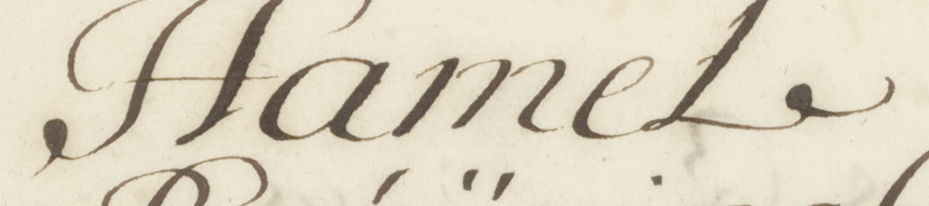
Hamel
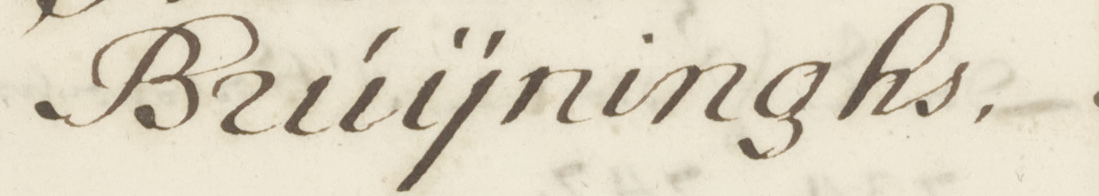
Bruijninghs
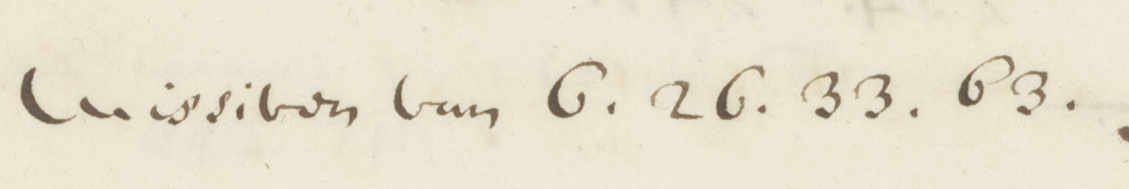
missiven van 6, 26, 33, 63.
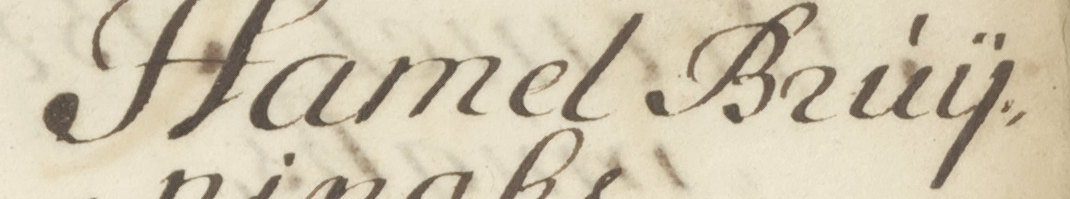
Hamel Bruij,,
